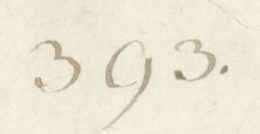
393.
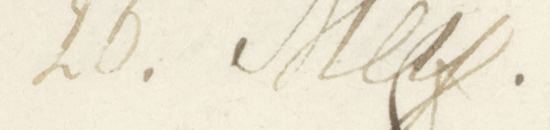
26. Meij
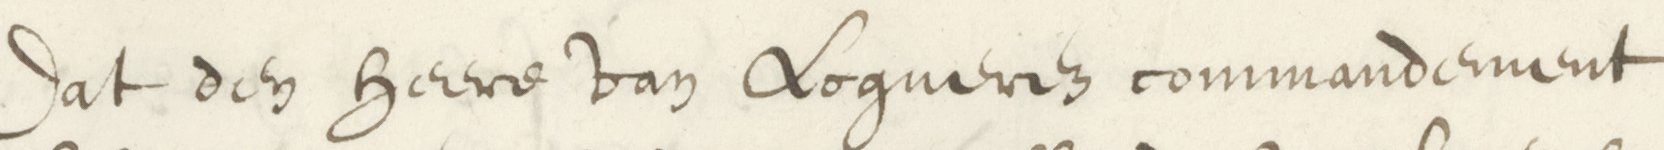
Dat den heere van Loqueren commandement
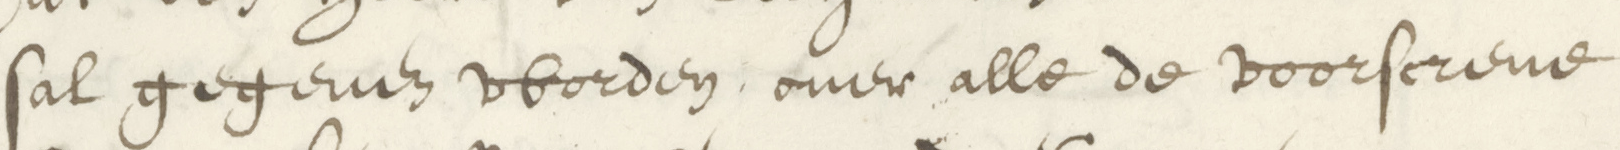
sal gegeuen worden ouer alle de voorscreue
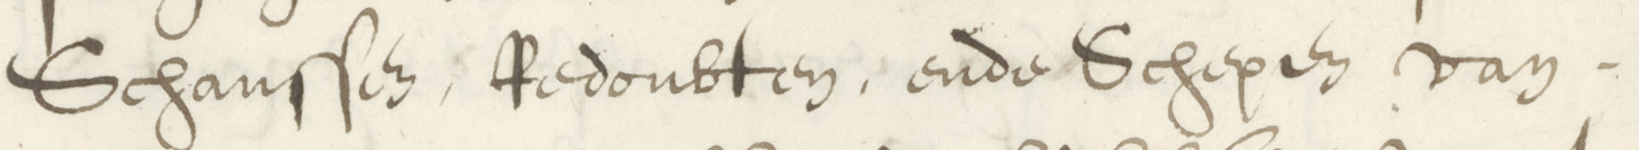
Schanssen, Redoubten ende Schepen van
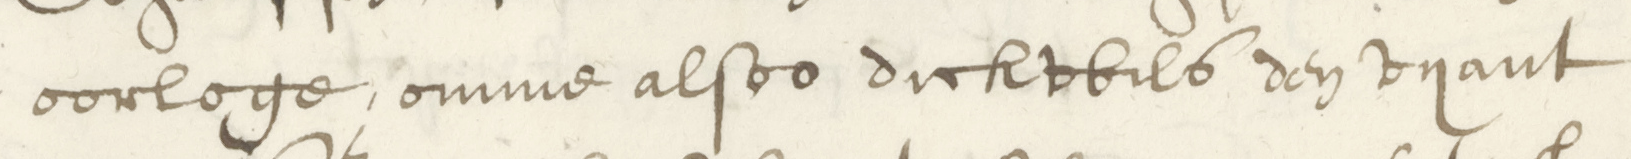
oorloge, omme alsoo dickwils den vyant
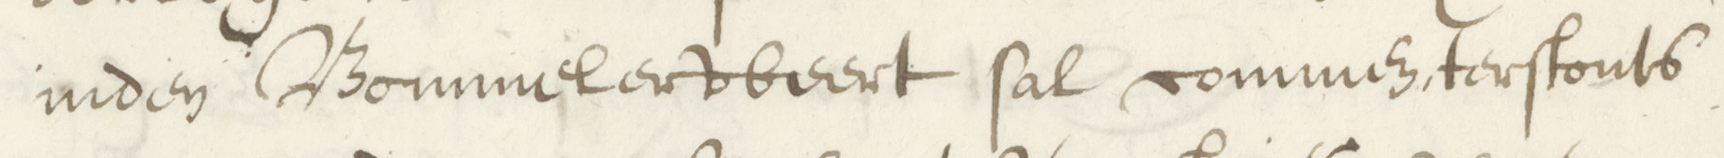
inden Bommelerweert sal commen, terstonts
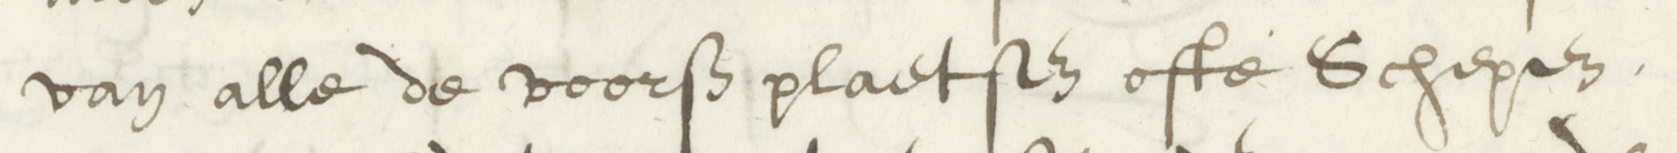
van alle de voors plaetsen ofte Schepen
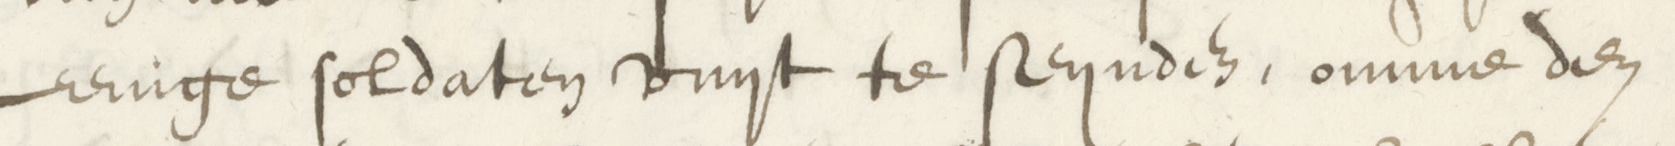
eenige soldaten vuyt te seynden, omme den
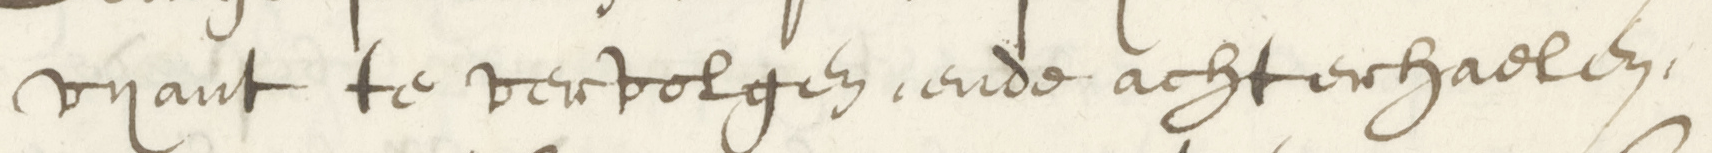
vyant te vervolgen, ende achterhaelen,
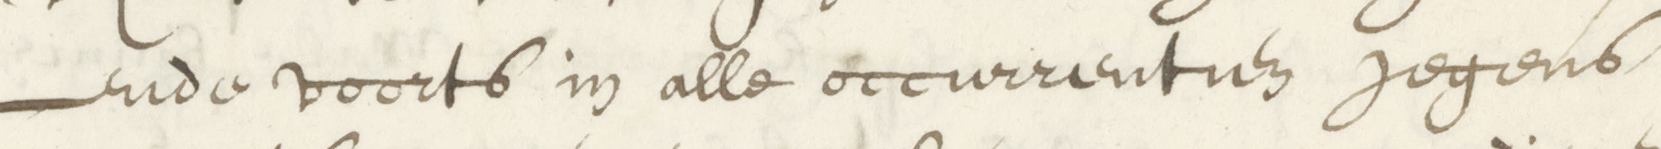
ende voorts in alle occurrentien jegens
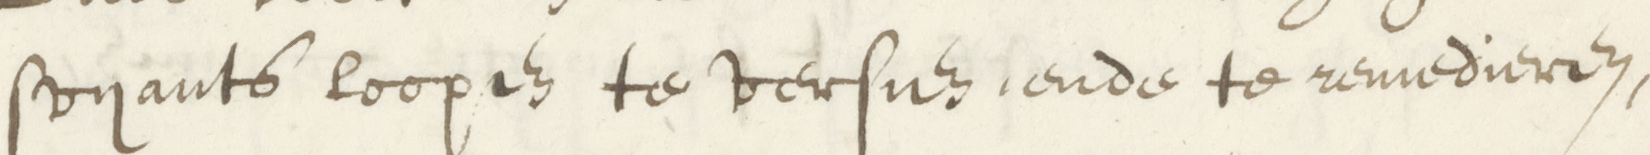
svyants loopen te versien, ende te remedieren.
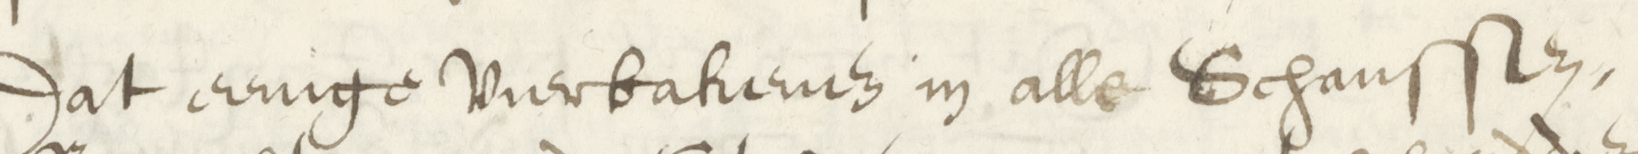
Dat eenige vuerbakenen in alle Schanssen,
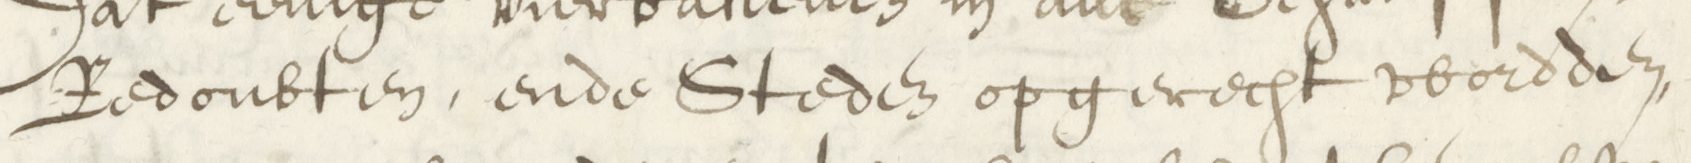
Redoubten, ende Steden opgerecht wordden,
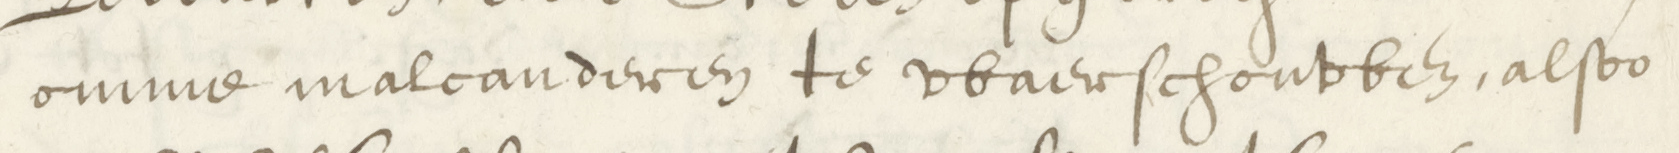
omme malcanderen te waerschouwen, alsoo
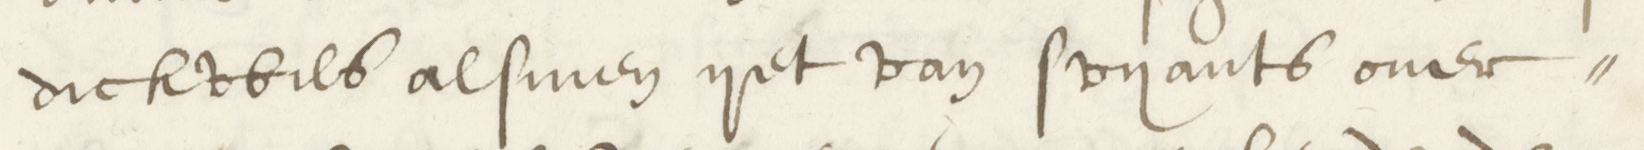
dickwils alsmen yet van svyants ouer„
